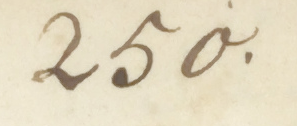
250.
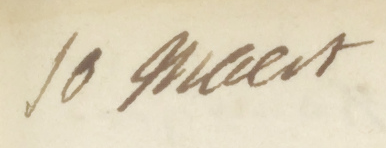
10 Maert
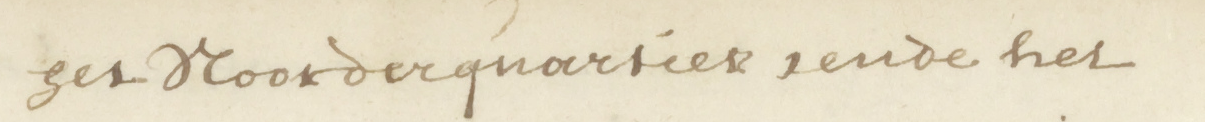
het Noorderquartier, ende het
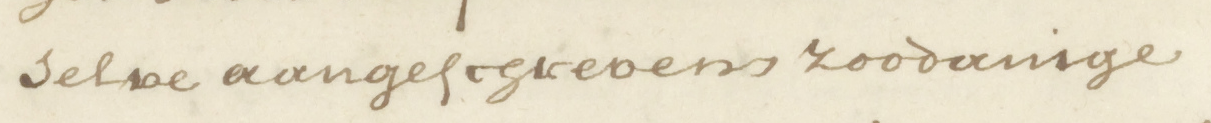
selve aangeschreven zoodanige
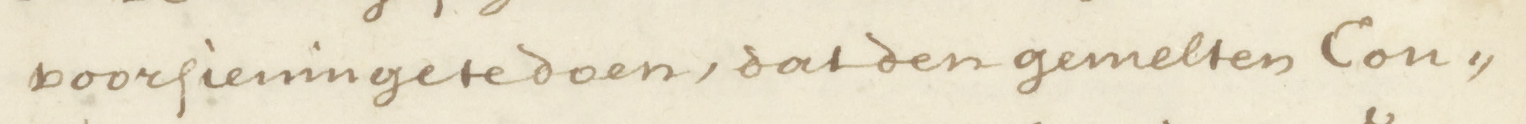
voorsieninge te doen, dat den gemelten Con„
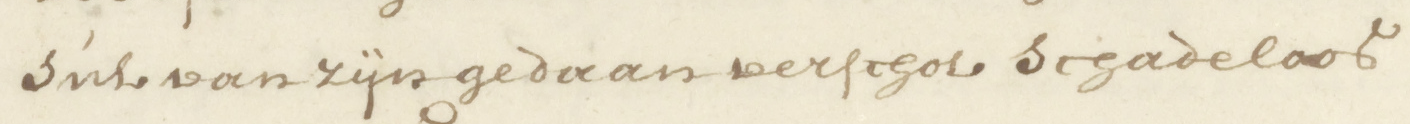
sul van zijn gedaan verschot schadeloos
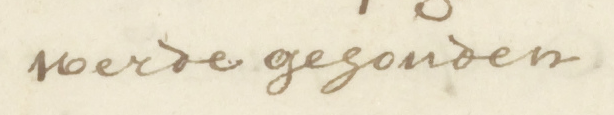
werde gehouden:
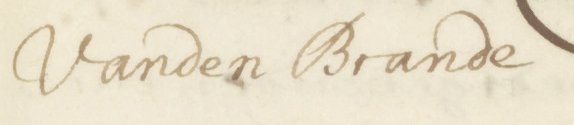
Vanden Brande
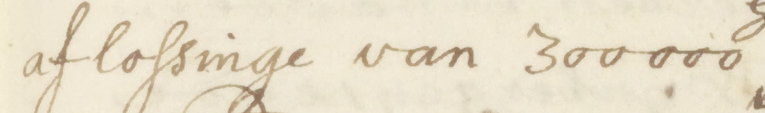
aflossinge van 300000
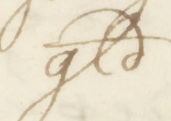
gld
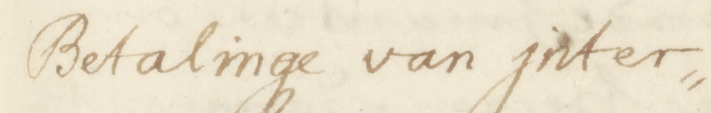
Betalinge van Inter„
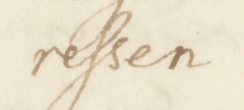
ressen
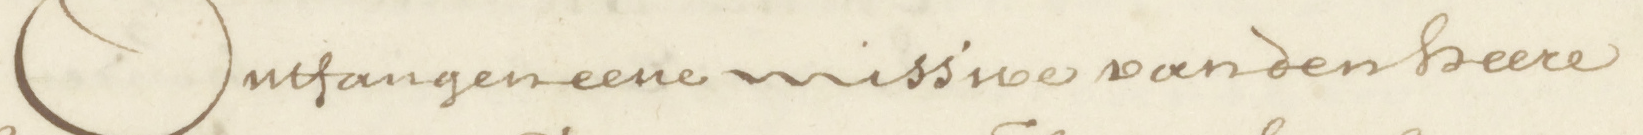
Ontfangen eene missive van den heere
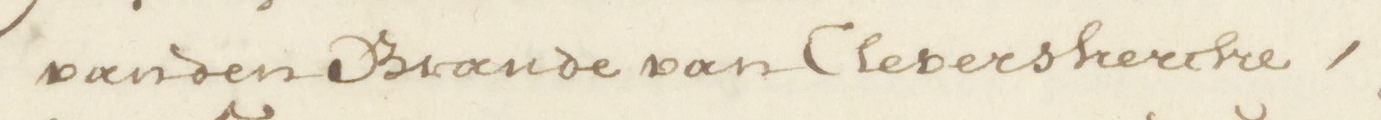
vanden Brande van Cleverskercke,
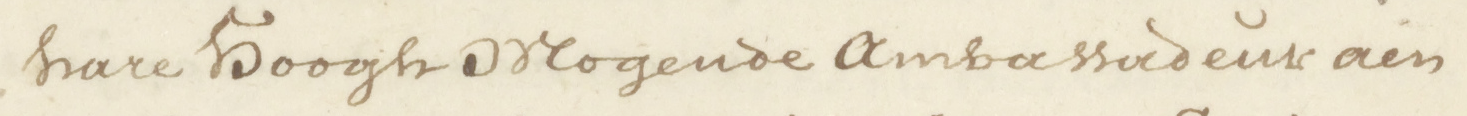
hare Hoogh Mogende Ambassadeur aen
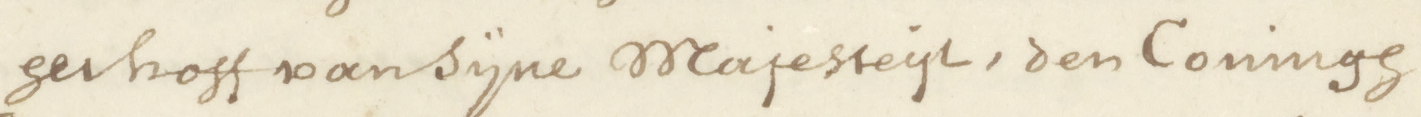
het hoff van sijne Majesteijt, den Coningh
